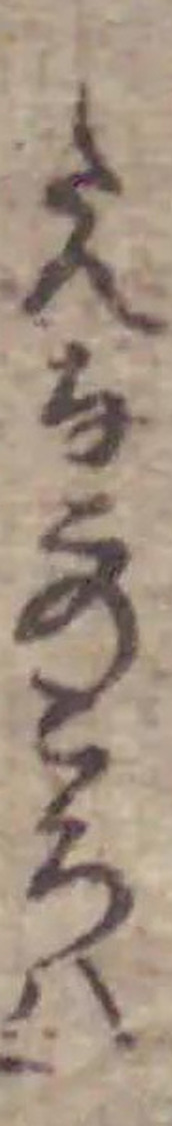たんなこのころは
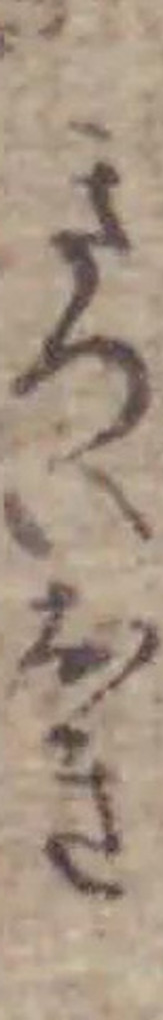きついおき
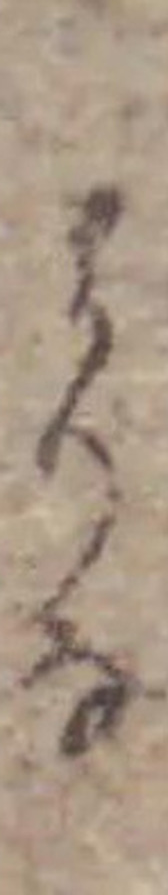まりな

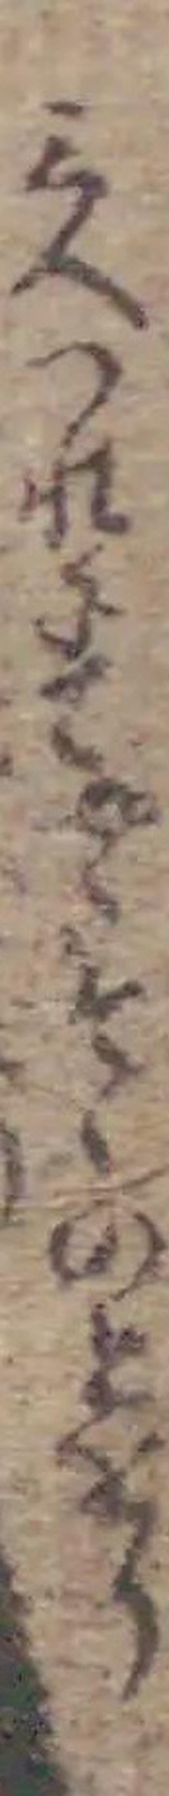三人つれにてやくそくのとをり
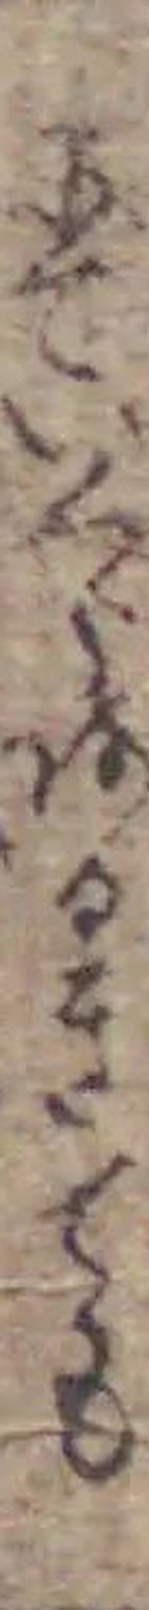にていくらあるきても
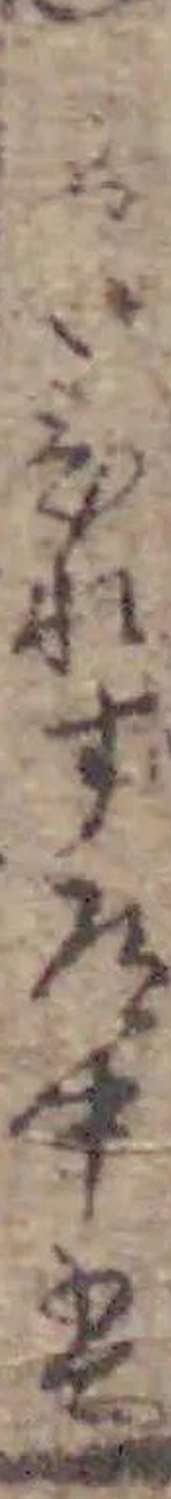くたひれず道中にて
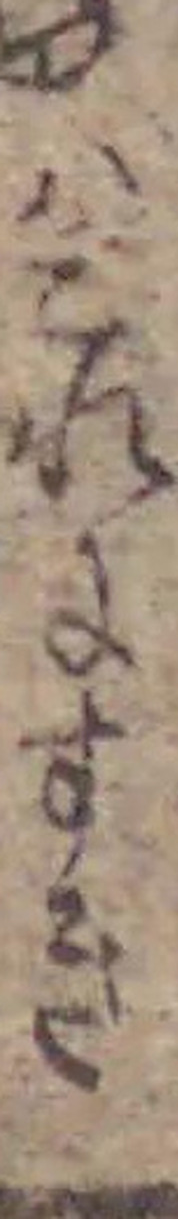はこれにすき
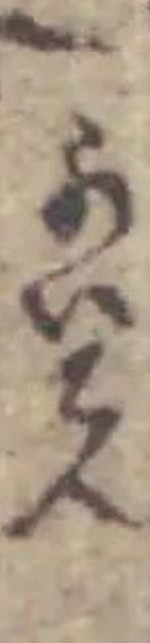よいてん
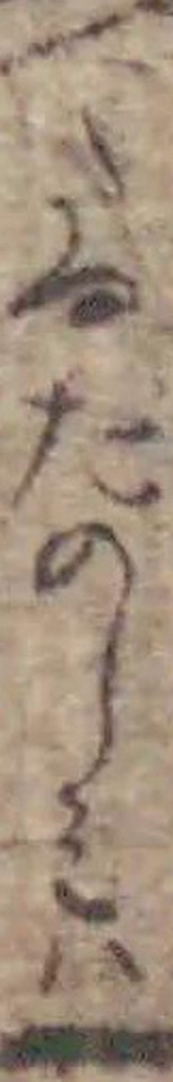たるたのしみは
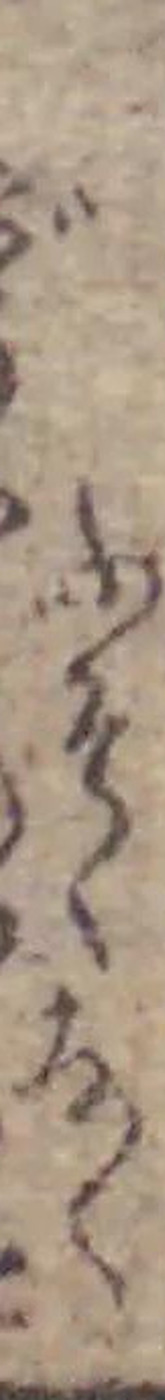ふそくなく
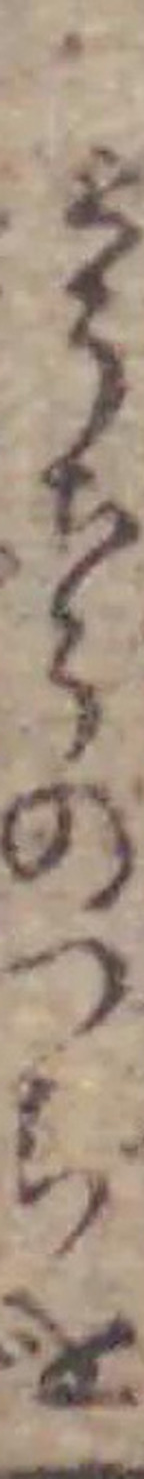どうちうのつちを
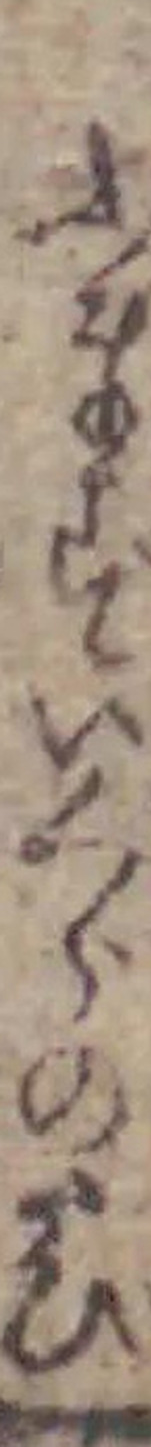ふまずいくらのたび
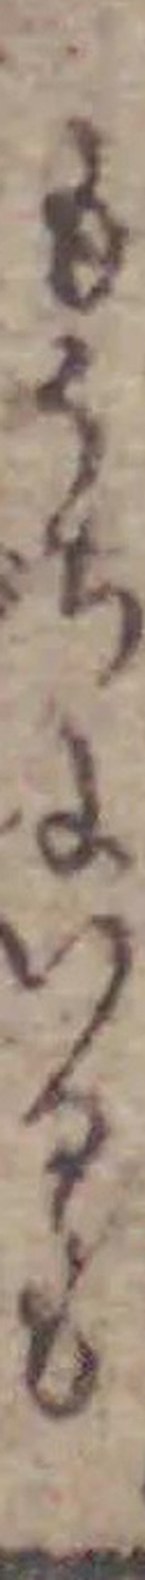もうちにいるも
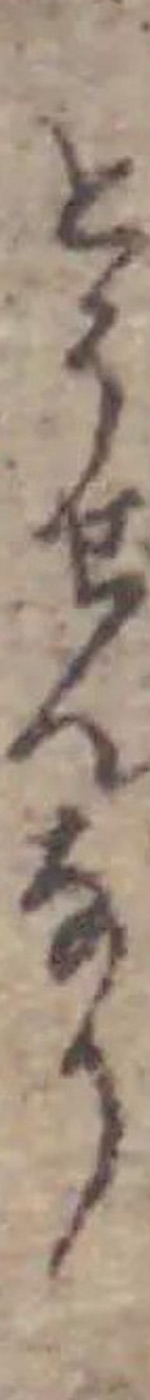とうぜんなり
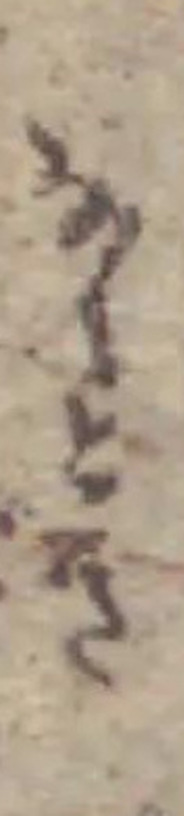なゝとき
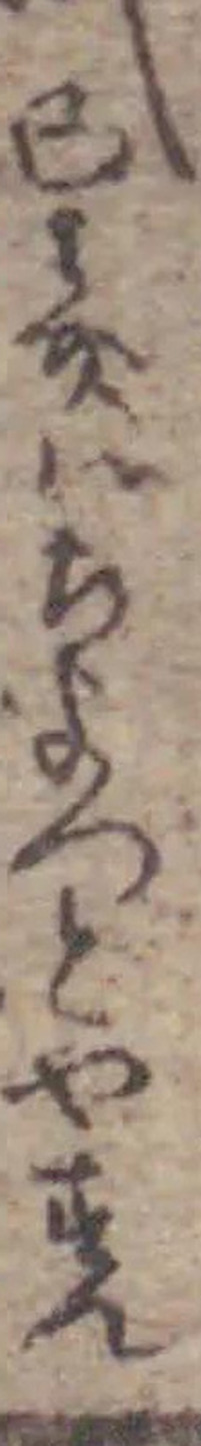「巳之介はちよつとやすん
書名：日待御利生此ごろ噂 3巻
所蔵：国立国会図書館 National Diet Library, JAPAN
